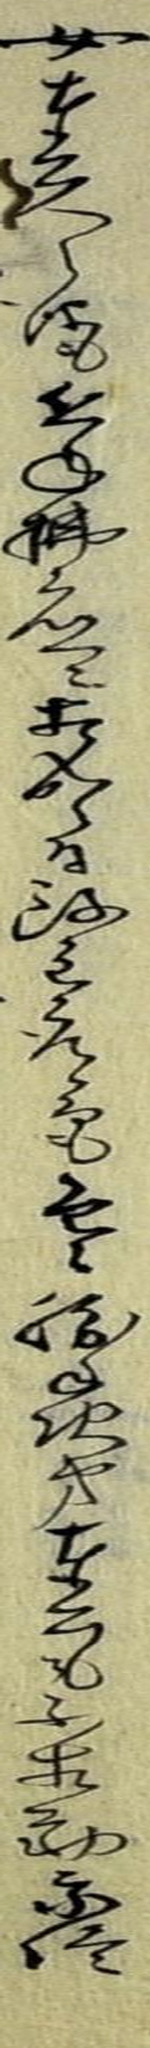一女奉公人之儀も近年払底に相成に付致主取候而も色々勝手次第奉公も不相勤我侭
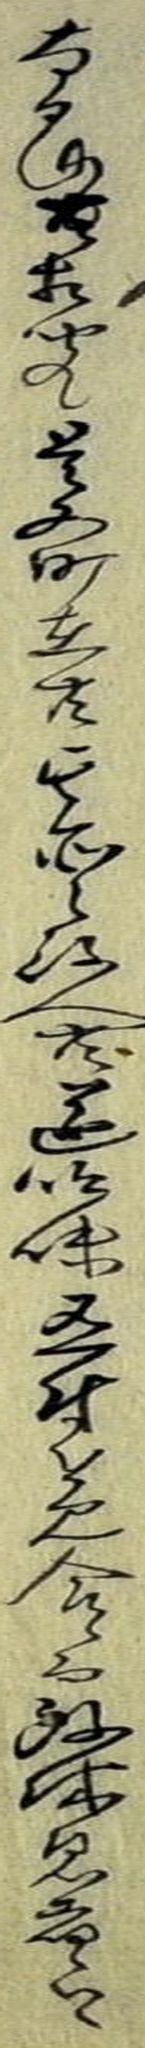なる趣共相聞候是又町在共其所之役人共遂吟味有付を見合候而致休息者候はゝ
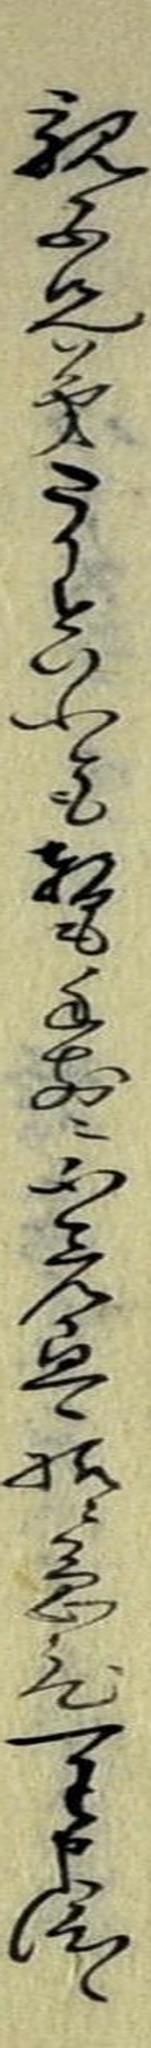親子兄弟たりといふとも暫も手前に不差置候様に急度可被申渡候
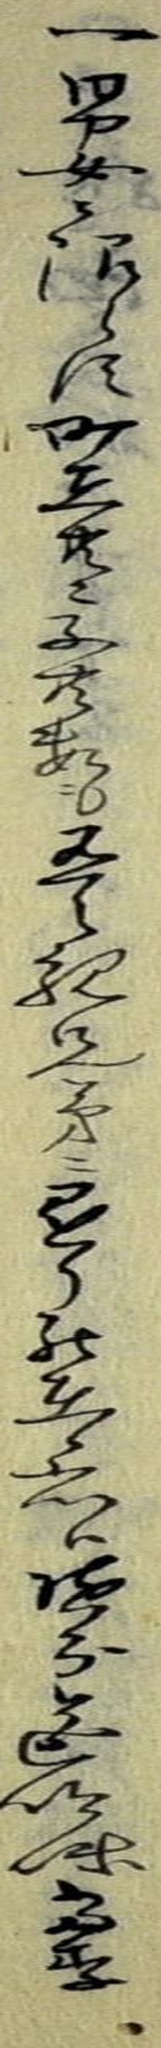一男女に限らす町在共に子共数も有之親兄弟に懸り罷在候者は随分遂吟味当季
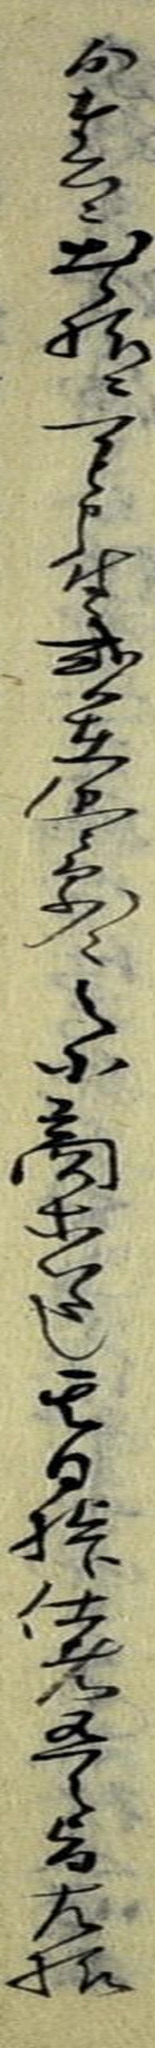ゟ奉公に出候様に可被申付候或は在近に而少々之小商等いたし其日挊仕者有之旨左様
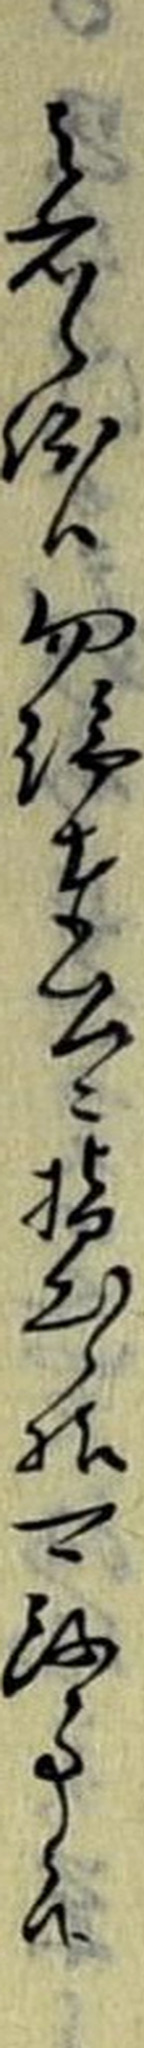之者之儀は勿論奉公に指出候様可致事に候
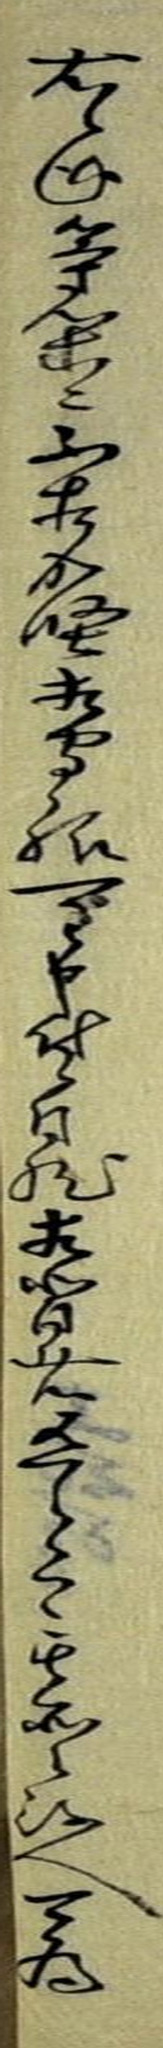右之趣等閑に不相成堅相守候様可被申付候自然相背者有之候はゝ其所之役人可為
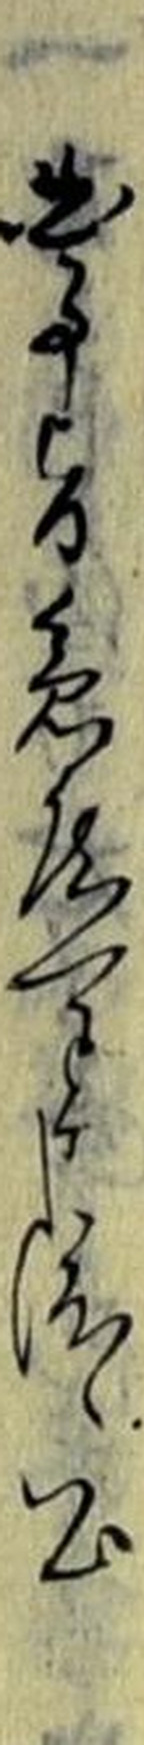曲事旨急度可被申渡候以上
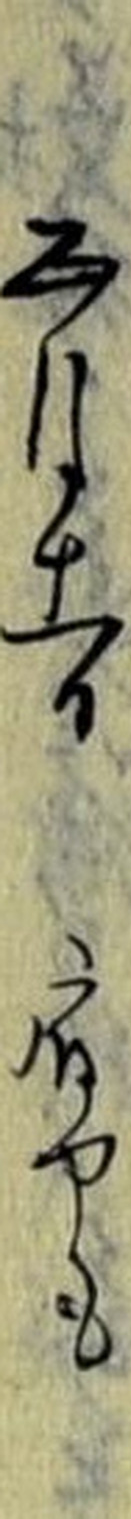正月十一日府中へも
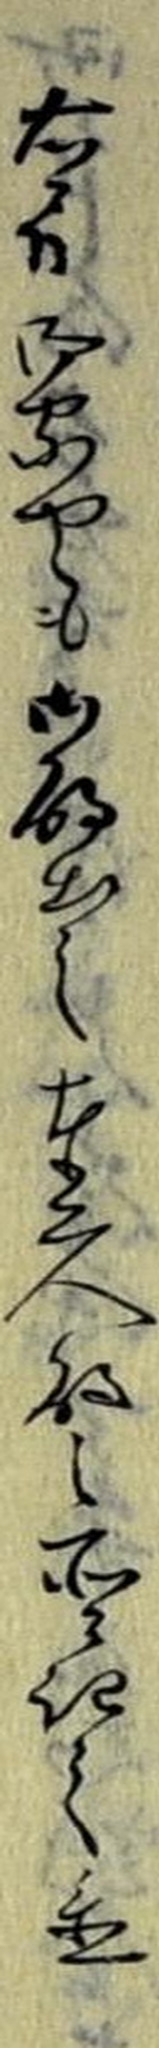右に付御家中へも御触出之奉公人触之所に記之置
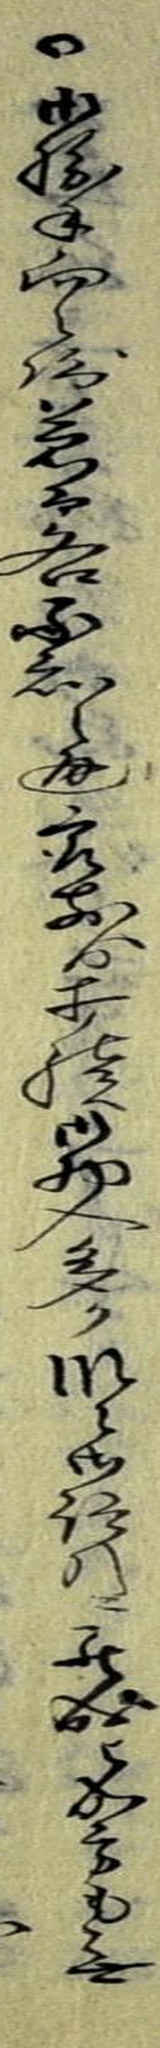〇御勝手向之儀兼而各承知之通最前ゟ打続御物入多く段々御跡引に罷成被成方も無
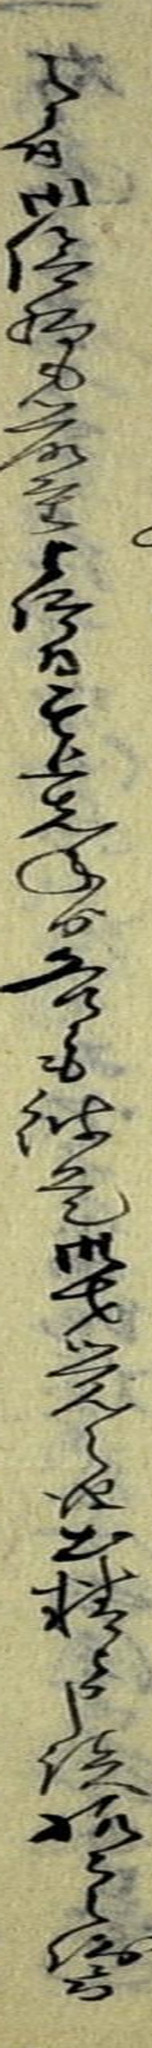之に付御倹約も厳重被仰付其上先年ゟ各にも彼是御才覚之儀出精被申談様に之儀に而
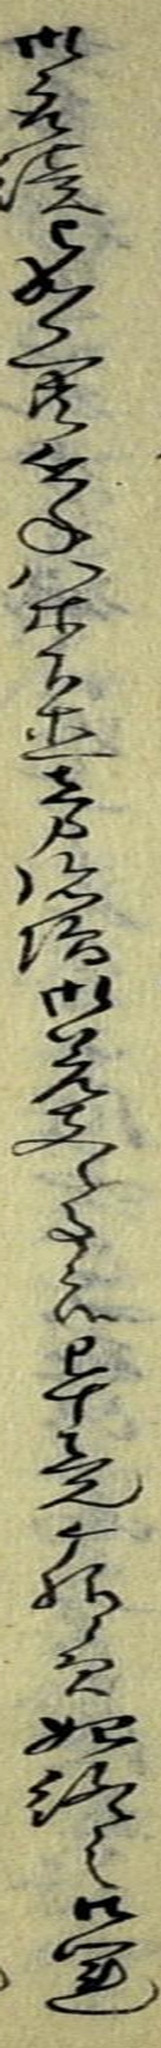御取続被成候へ共近年八木下直旁諸増御差支之事に候畢竟ヶ様に而は始終之御運
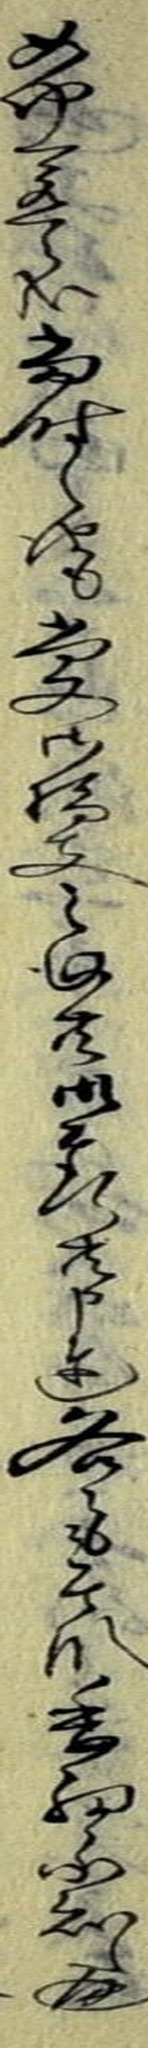如何可有之哉当時之儀も尚又御指支之趣共御奉行共申達各にも其段委細承知之通
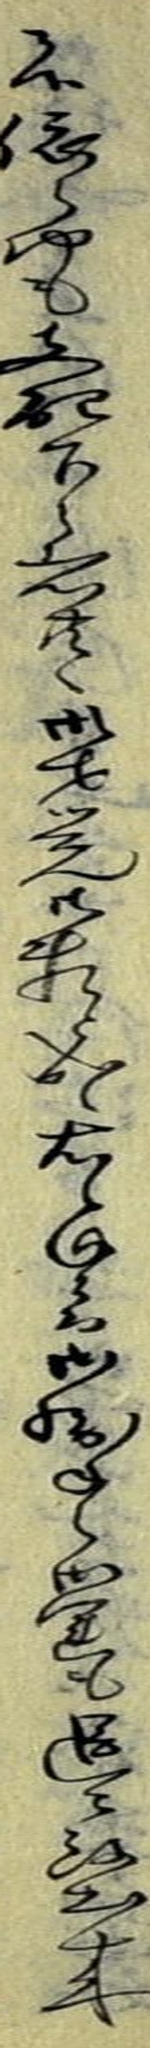に候依之何も支配下之者共へ御才覚御頼被成候右之趣に而御勝手之御運も追々致出来
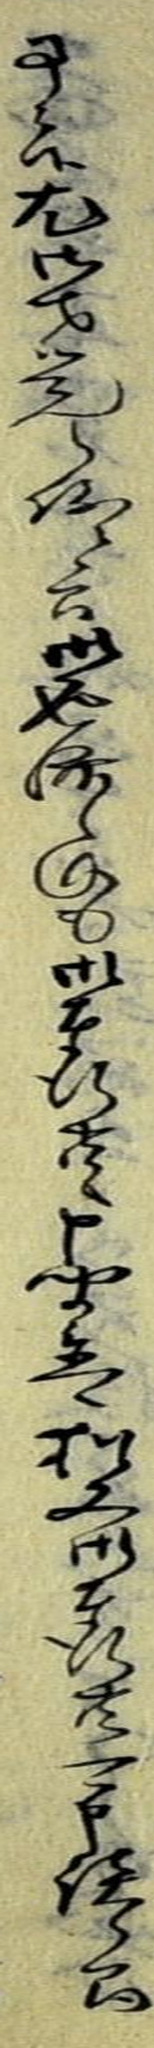事に候尤御才覚之儀に候間御返済候趣も御奉行共へ申聞置候猶又御奉行共可申談候間
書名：命令之部 二
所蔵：福井県文書館 Fukui Prefectural Archives
